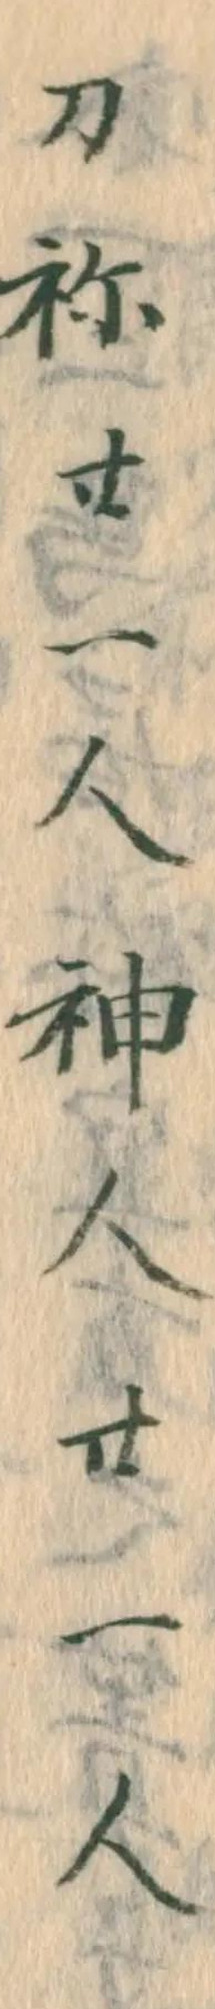刀祢廿一人神人廿一人
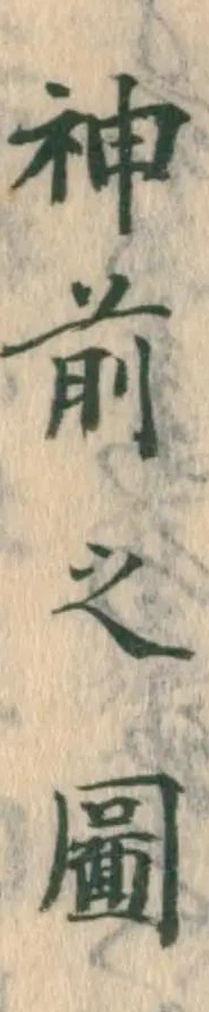神前之図
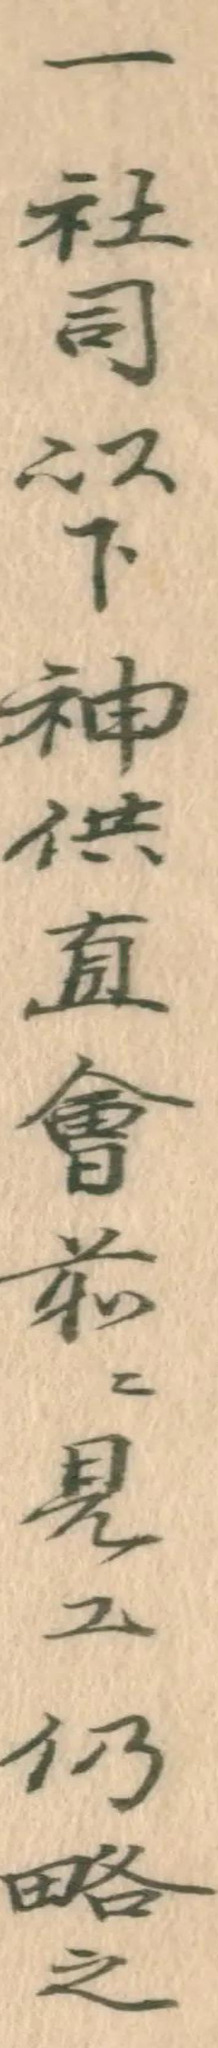一社司以下神供直会前ニ見ユ仍略之
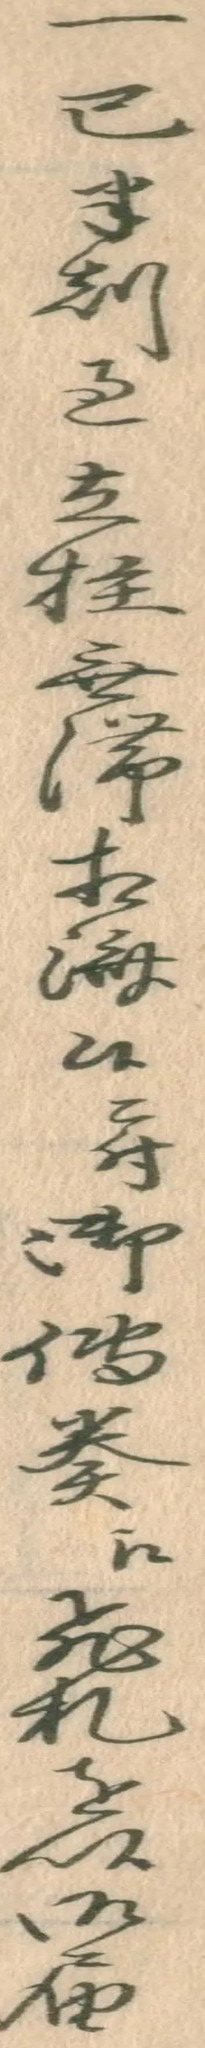一巳半刻過立柱無滞相済候ニ付御伝奏江飛札を以御届
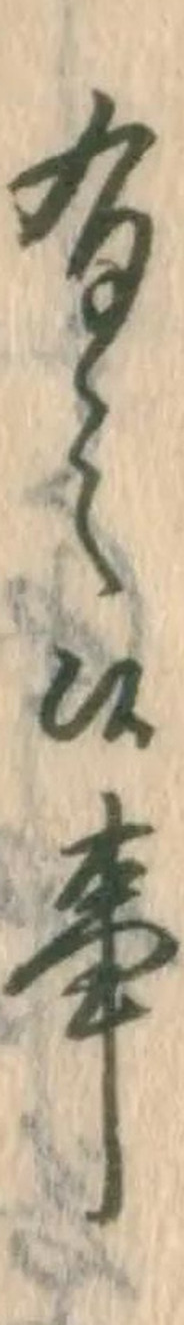有之候事
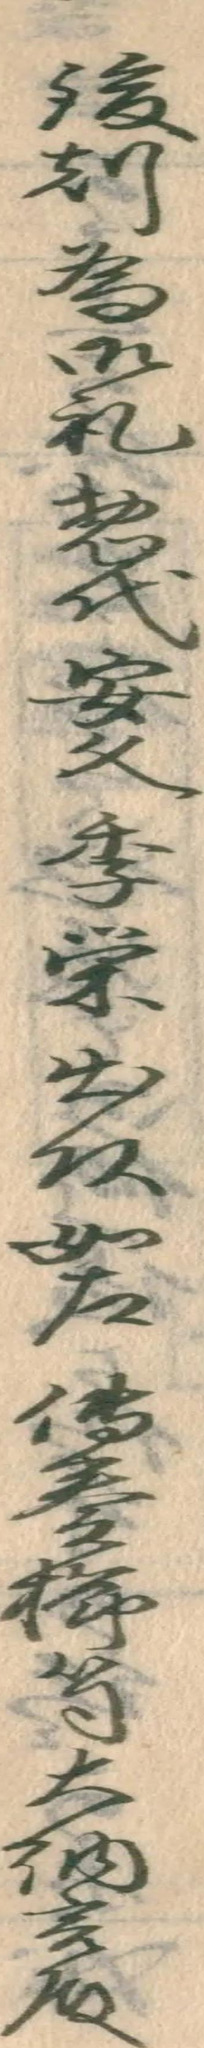一後刻為御礼惣代安久季栄出頭如左伝奏櫛笥大納言殿
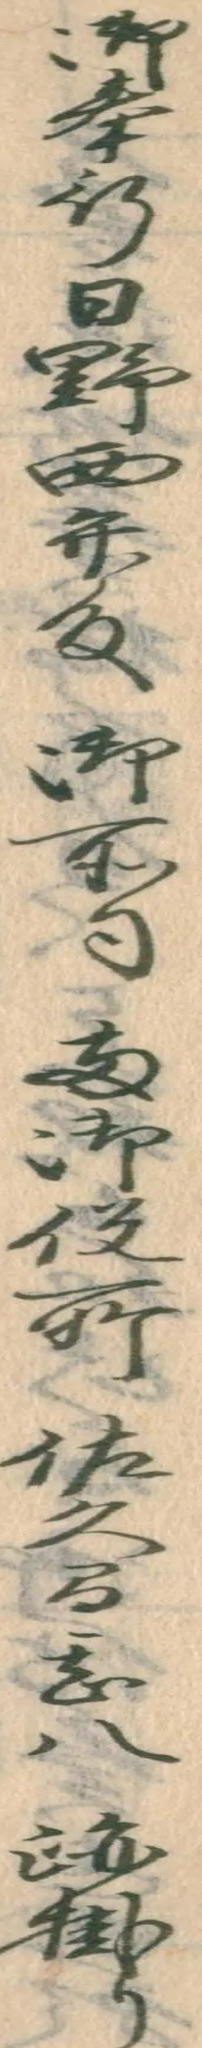御奉行日野西弁殿御所司両御役所佐久間甚八跡掛り
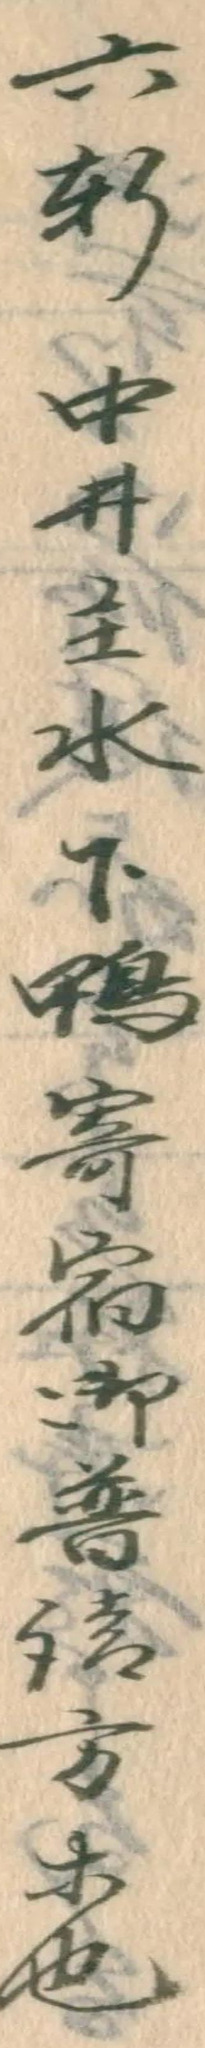六軒中井圭水下鴨寄宿御普請方等也
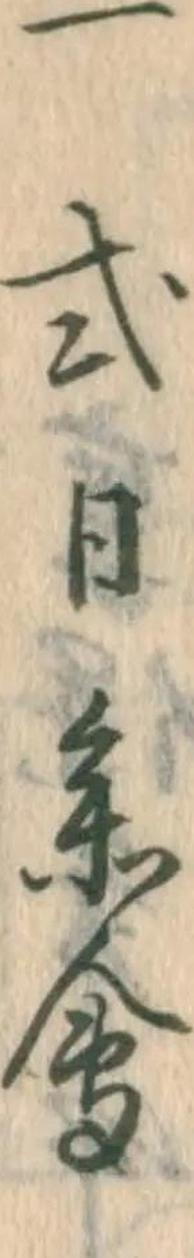一式日参会
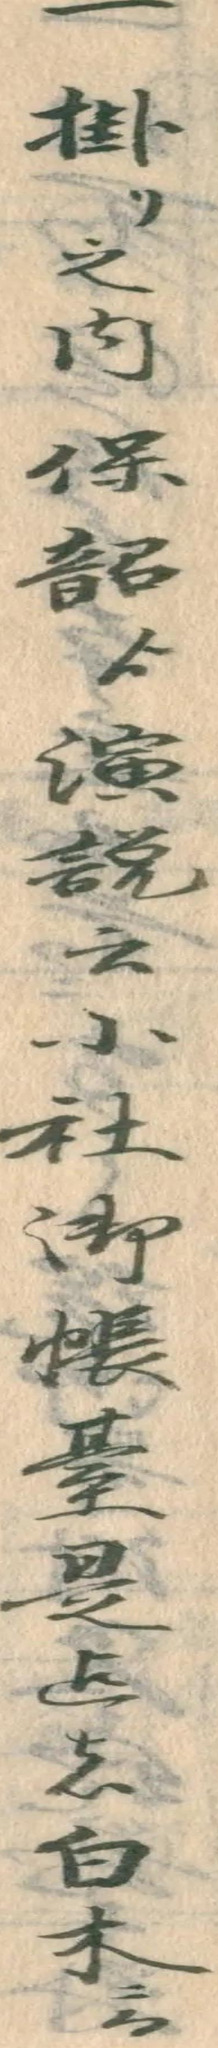一掛り之内保韶ゟ演説云小社御帳台是迄は白木ニ而
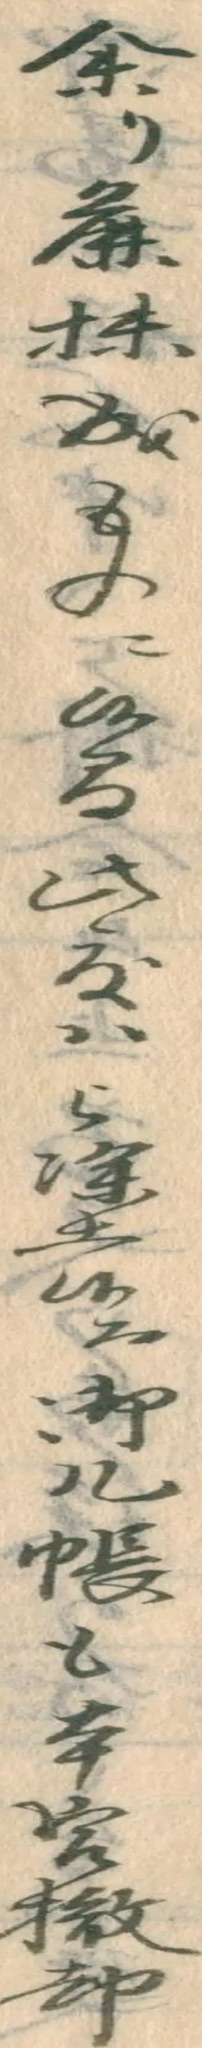余り麁抹成ものニ候間此度ハ被塗候而御几帳も本宮撤却
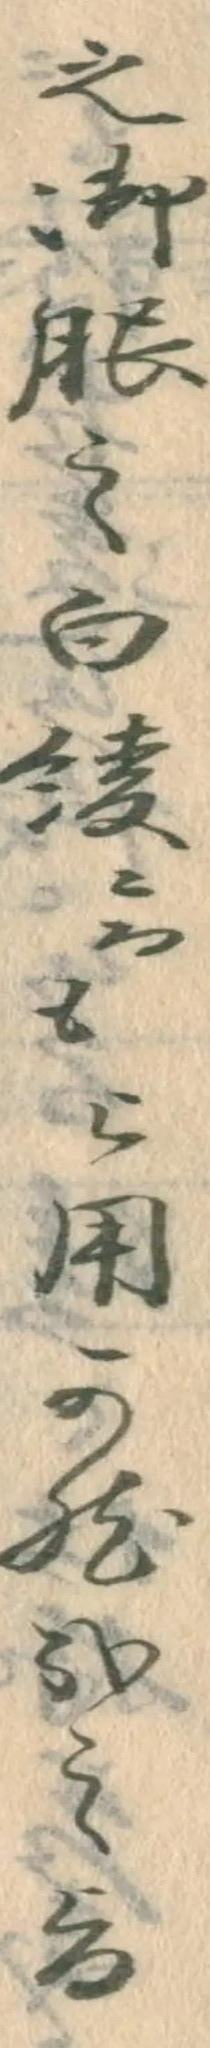之御服之白綾ニ而も被用可然哉之旨
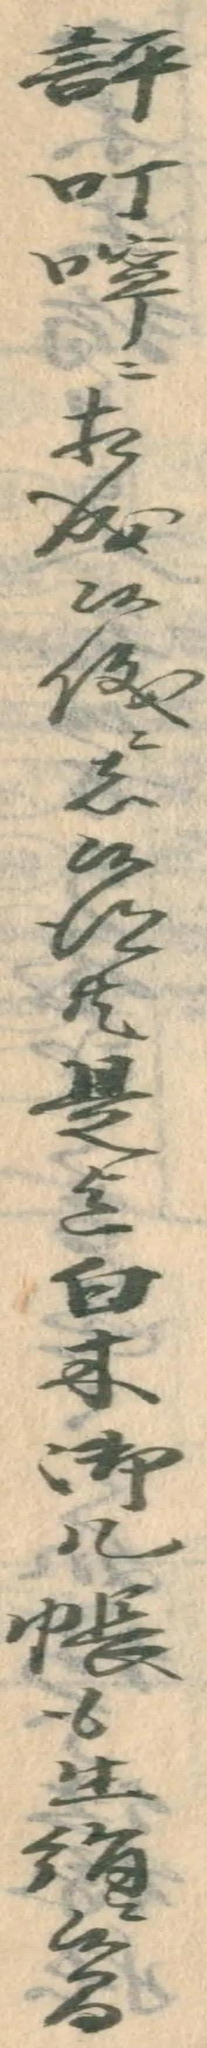評叮嚀ニ相成候儀ニは候得共是迄白木御几帳も生絹ニ候間

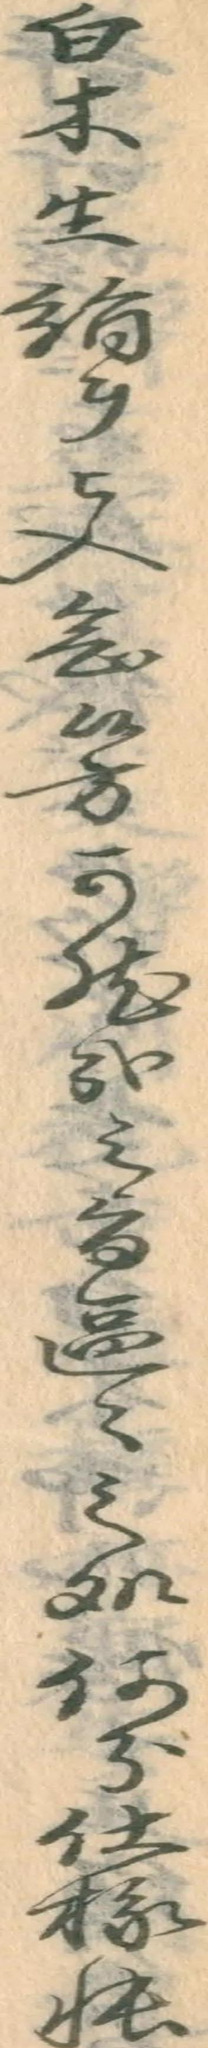白木生絹ヲ被入念候方可然哉之旨区々之処何分仕様帳
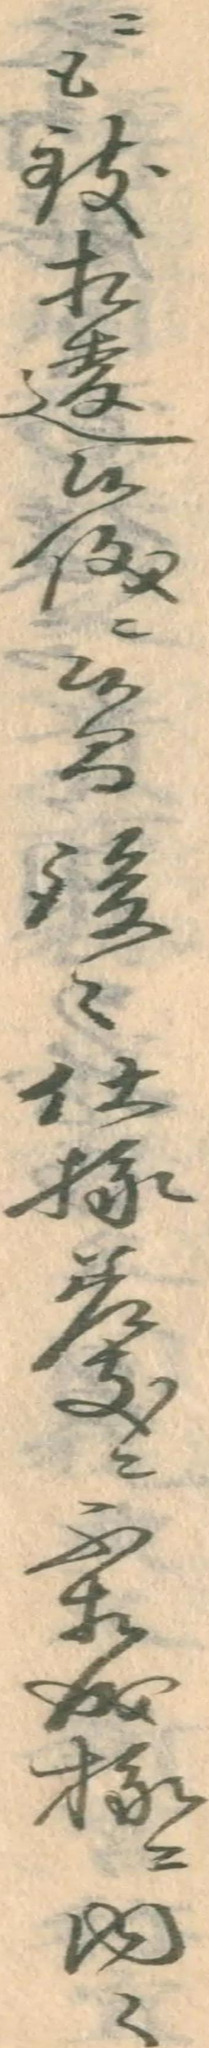ニも致相違候儀ニ候間後々仕様差支ニ不相成様ニ内々
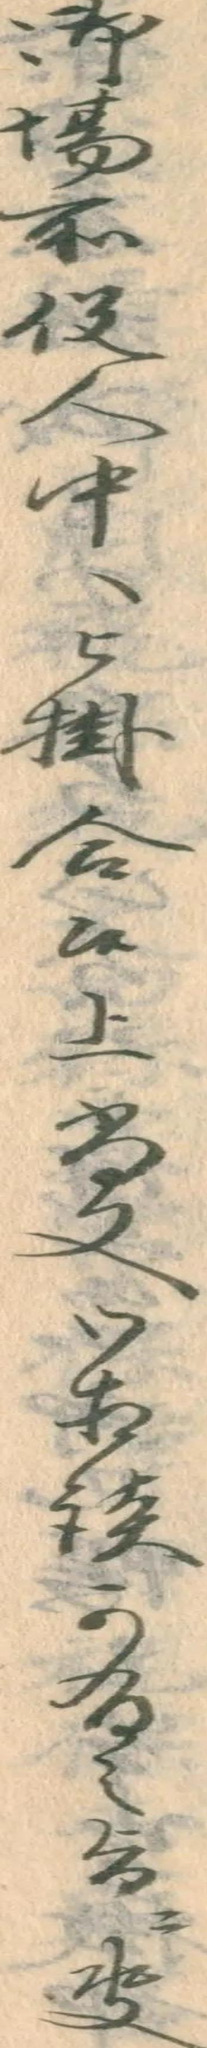御場所役人中へ被掛合候上尚又御相談可有之旨ニ決
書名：賀茂社記録. 第17冊
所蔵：国立国会図書館 National Diet Library, JAPAN
